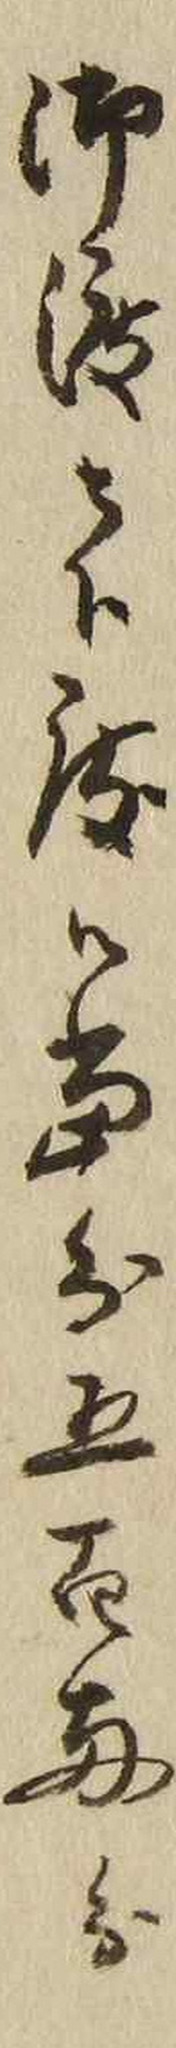御渡被下度御当分五百両分
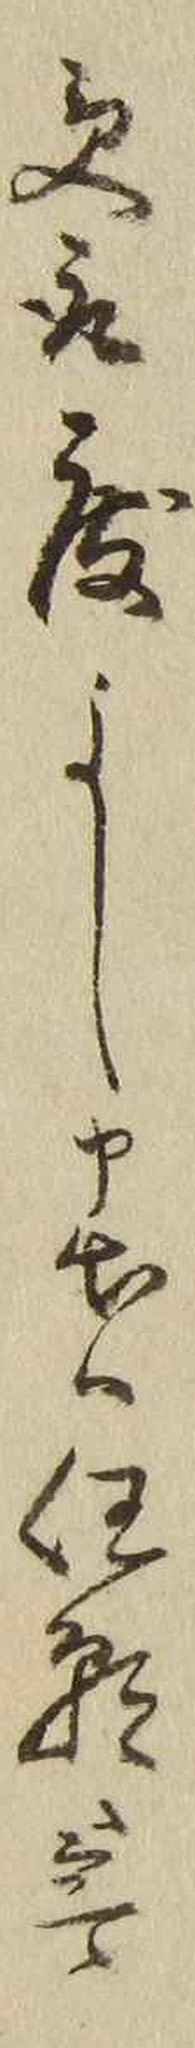受取度よし申出候任願ニ而可

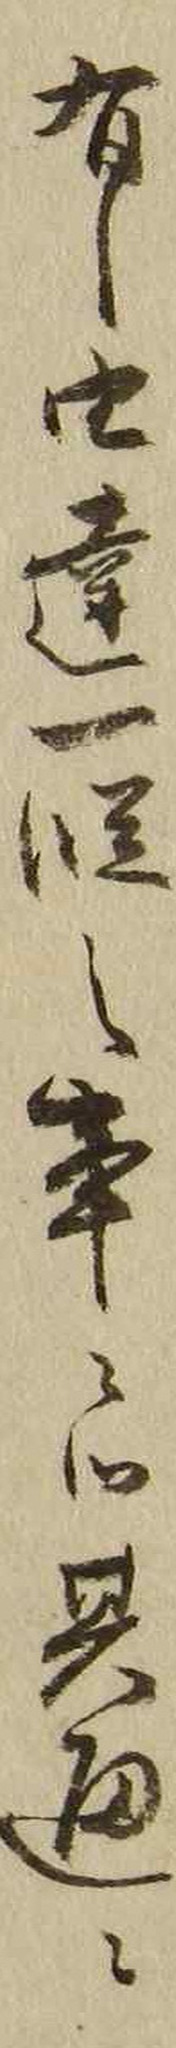有之由達一段之事ニ候其通ニ
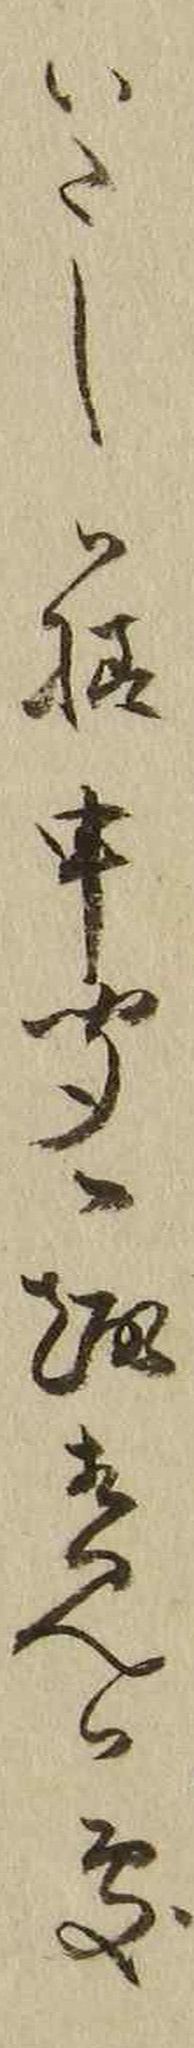いたし候様申聞候趣相見候処
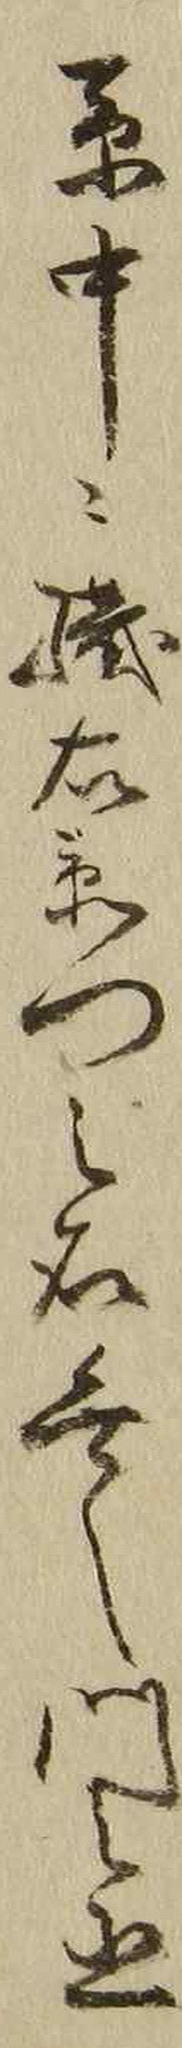系中ニ磯右衛門之名無之門之丞
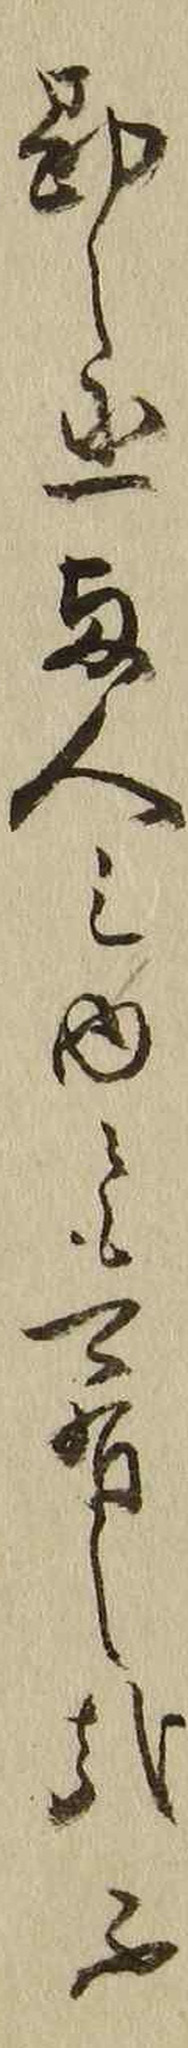勘之丞両人之内とも可有之哉不
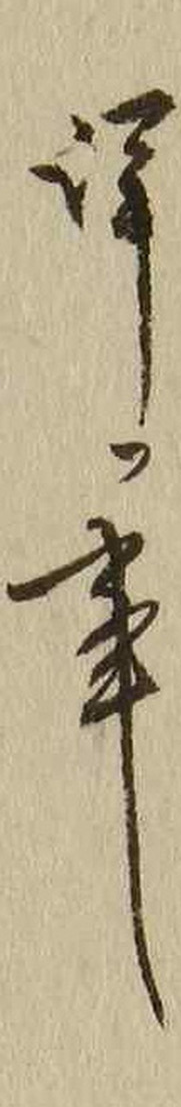詳候事
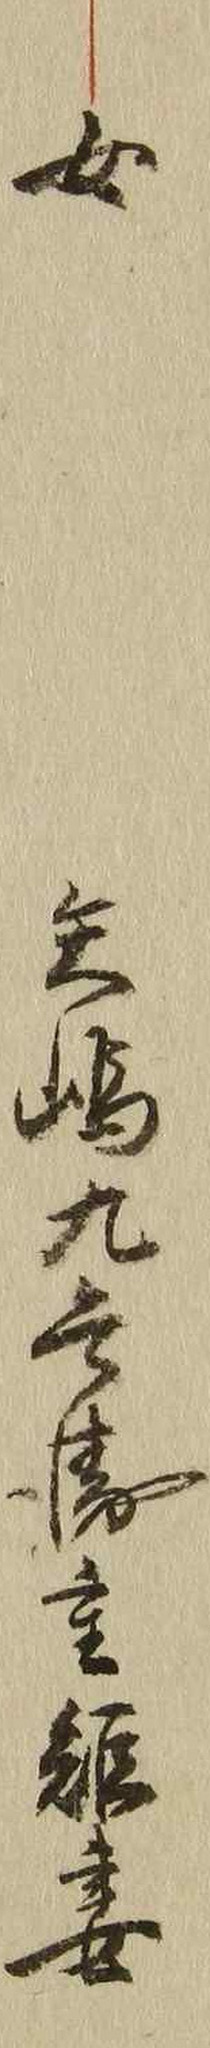女矢島九兵衛重短妻
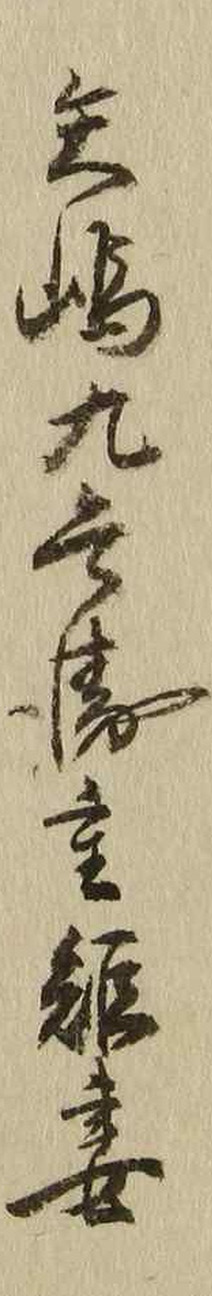女矢島九兵衛重短妻
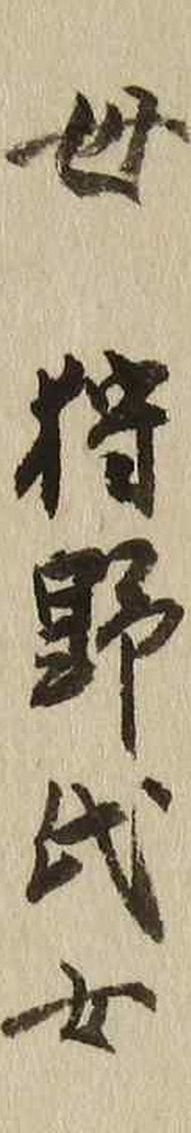母狩野氏女
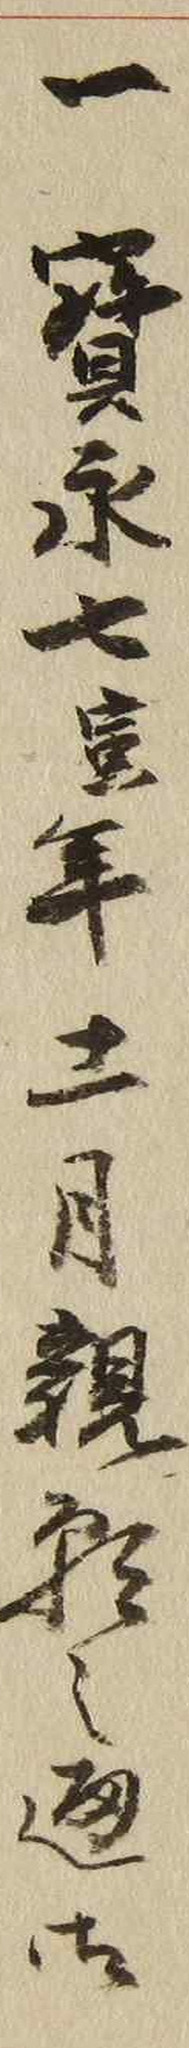一宝永七寅年十二月親願之通御
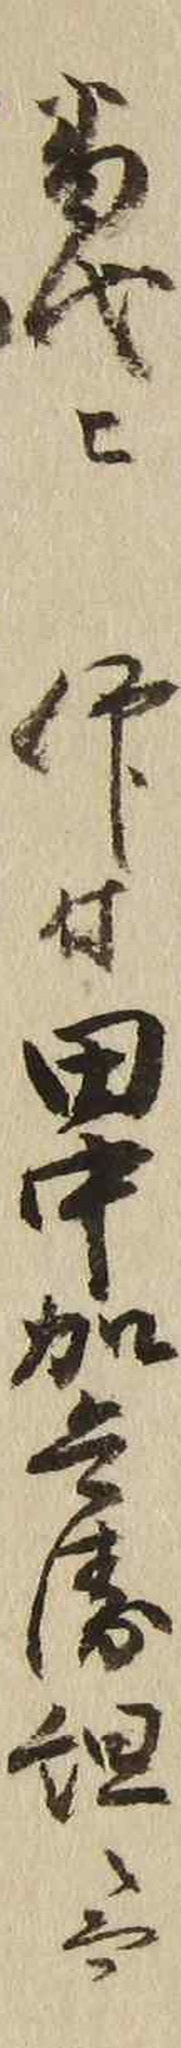番代被仰付田中加兵衛組ニ而
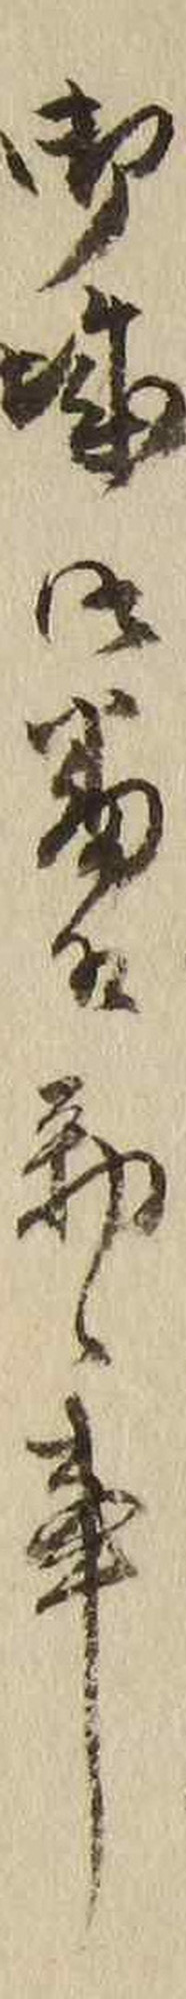御城御番御相勤候事
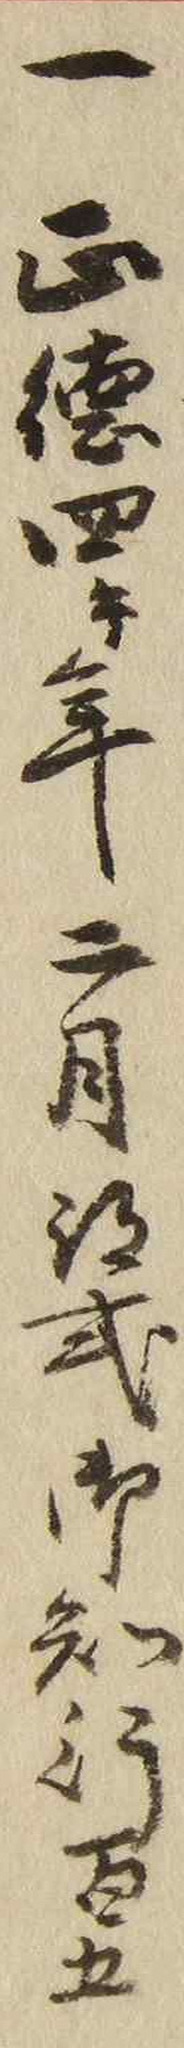一正徳四午年二月跡式御知行百五

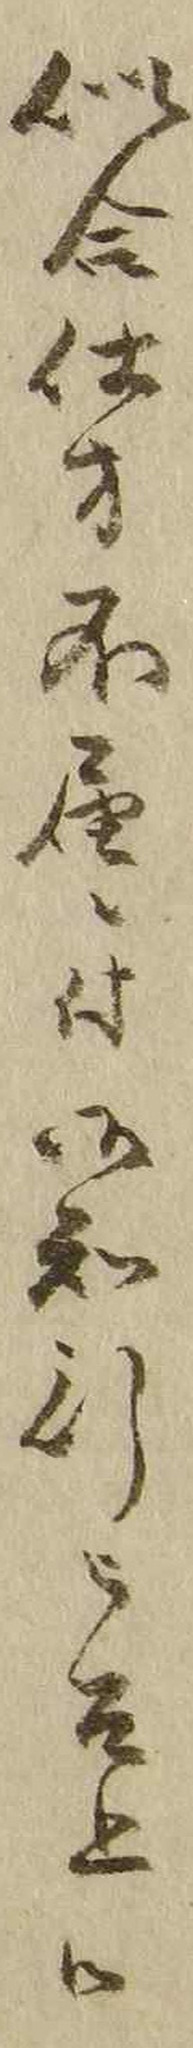似合仕方不届ニ付御知行被召上候
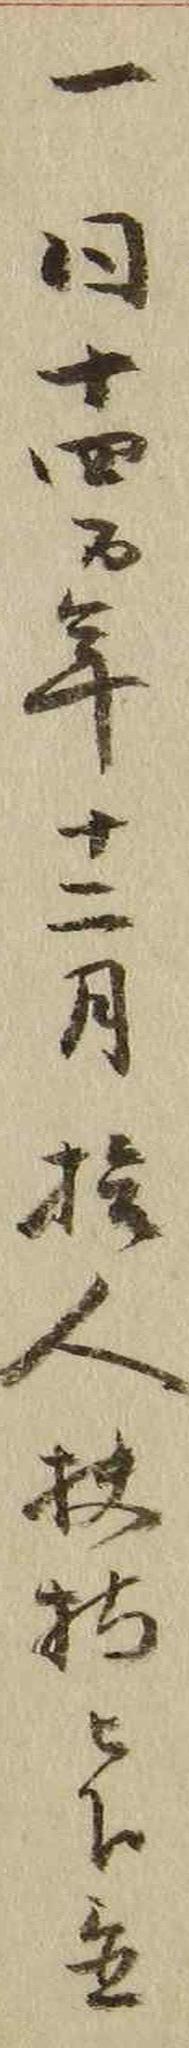一同十四酉年十二月拾人扶持被下置
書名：諸士系譜　巻之232　け之部1
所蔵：会津若松市立会津図書館
